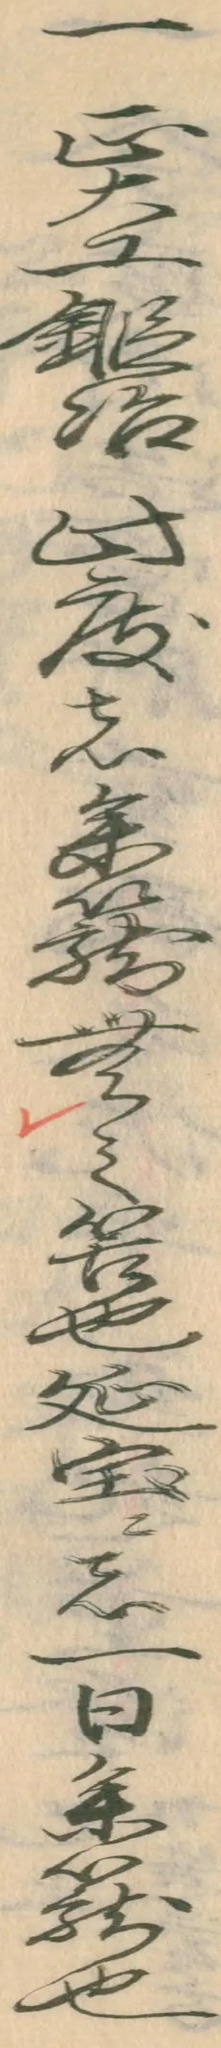一正大工鍛冶此度者参籠無之筈也延宝ニ者一日参籠也
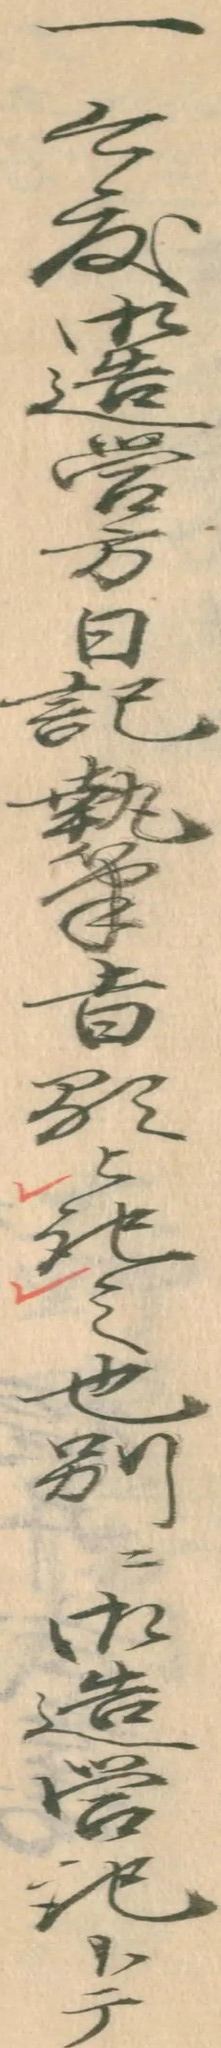一今度御造営方日記執筆旨顕被記之也別ニ御造営記トテ
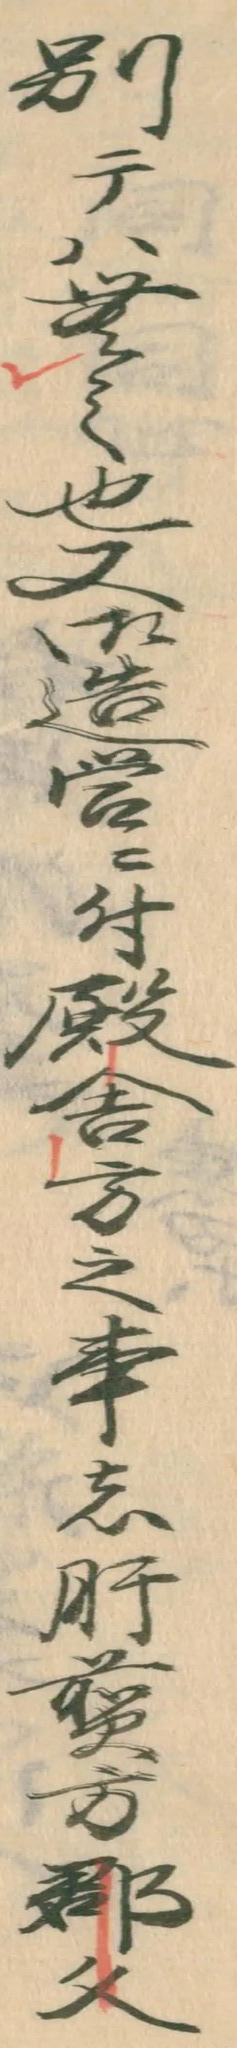別テハ無之也又御造営ニ付殿-舎_方之本者肝煎方郡久
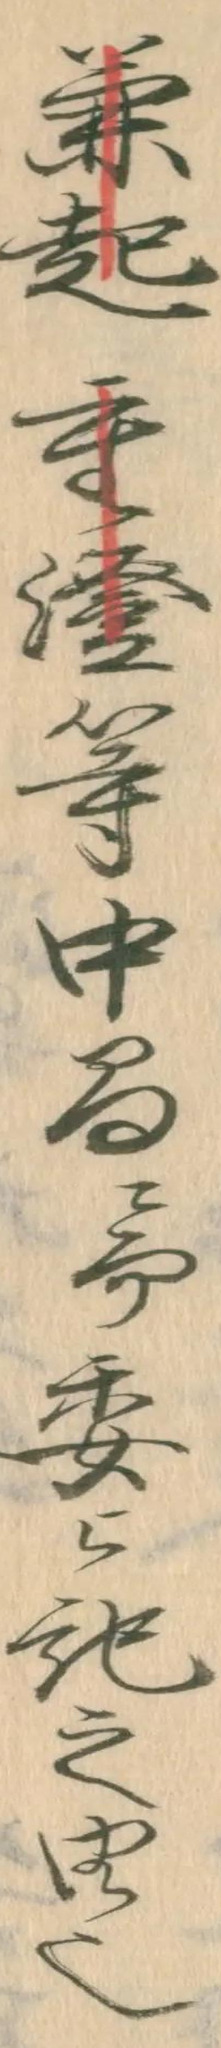兼起重澄等中間ニ而委被記之由也
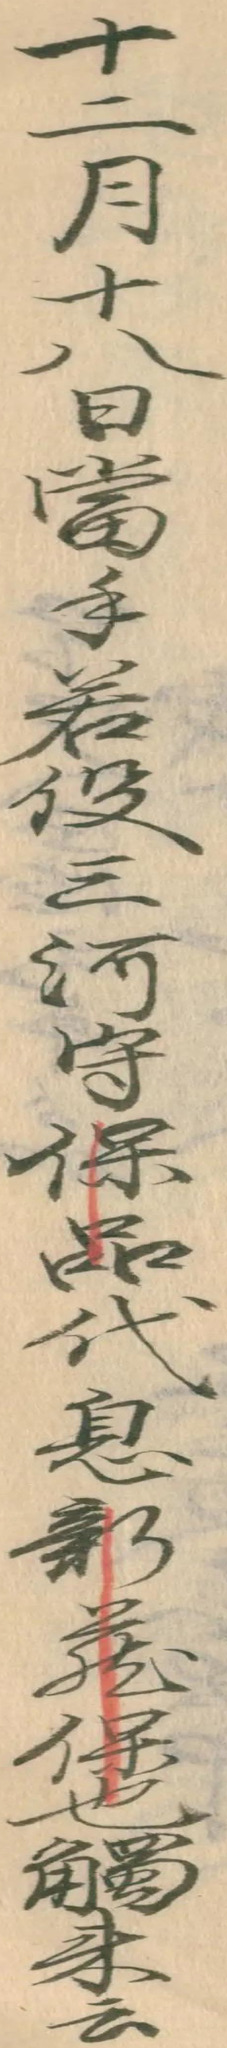十二月十八日当手若役三河守保品代息新蔵保也触来云
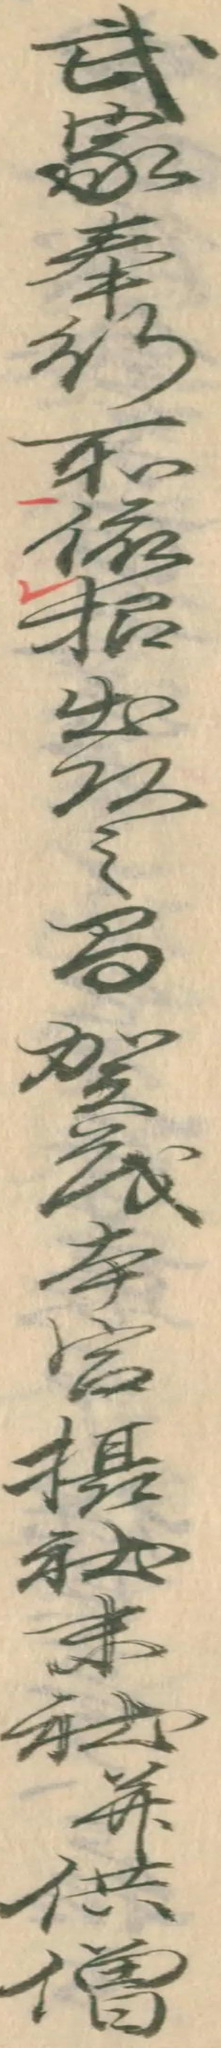武家奉行所依招出頭之間賀茂本宮摂社末社并供僧
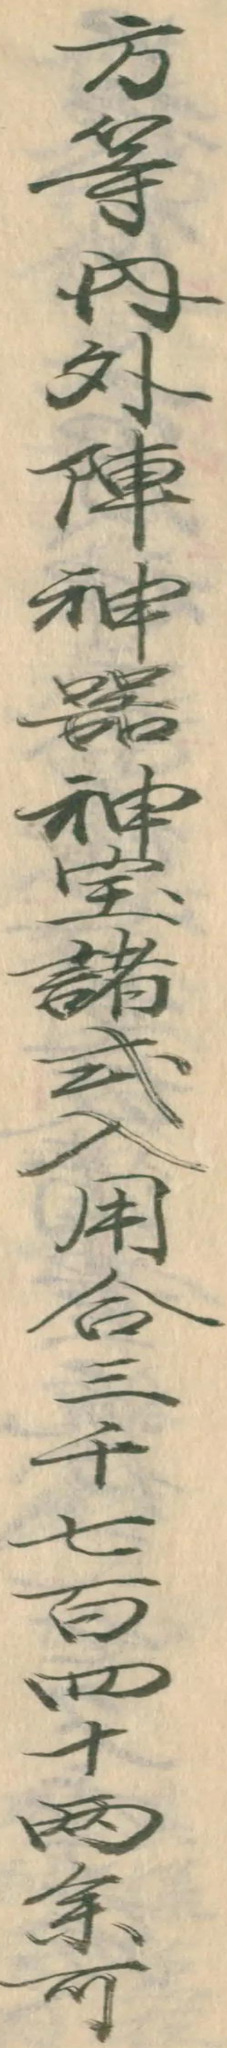方等内外陣神器神宝諸式入用合三千七百四十両余可
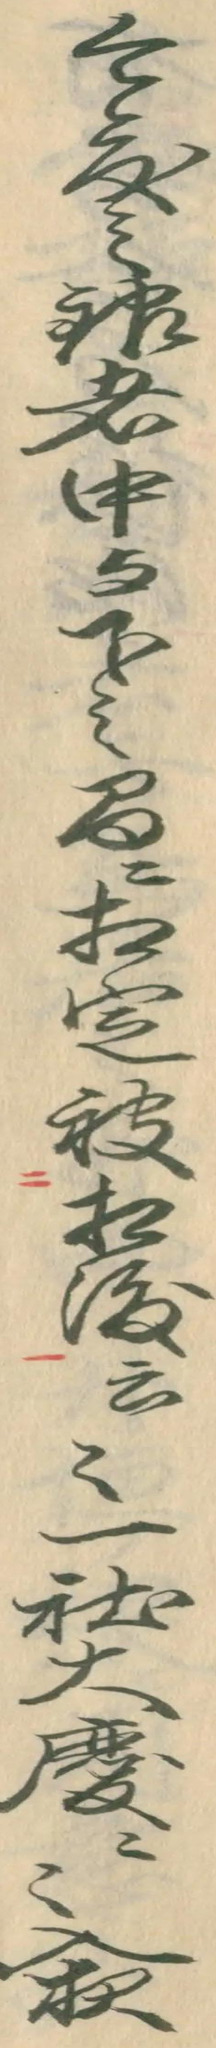今度之銀者中与下之間ニ相定被相渡云々一社大慶々々入夜

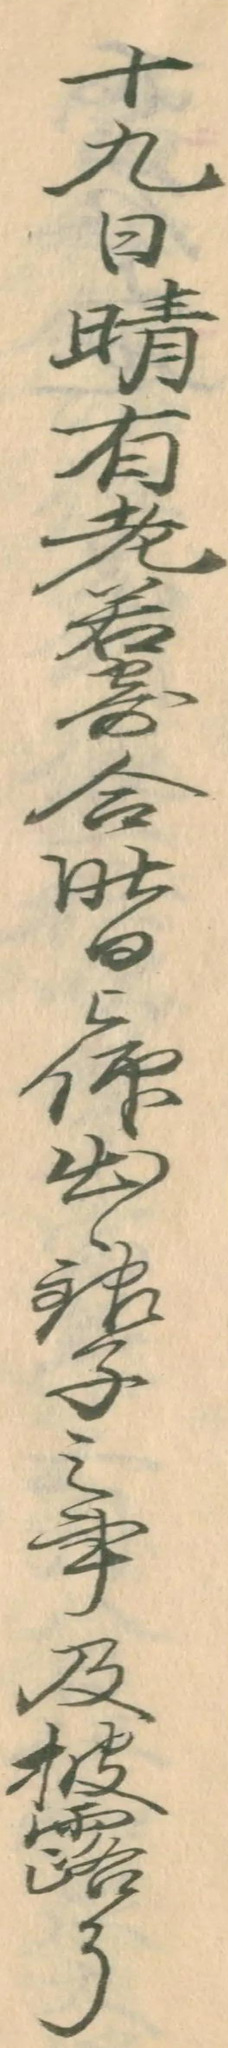十九日晴有老若寄合昨日被仰出候銀子之事及披露了
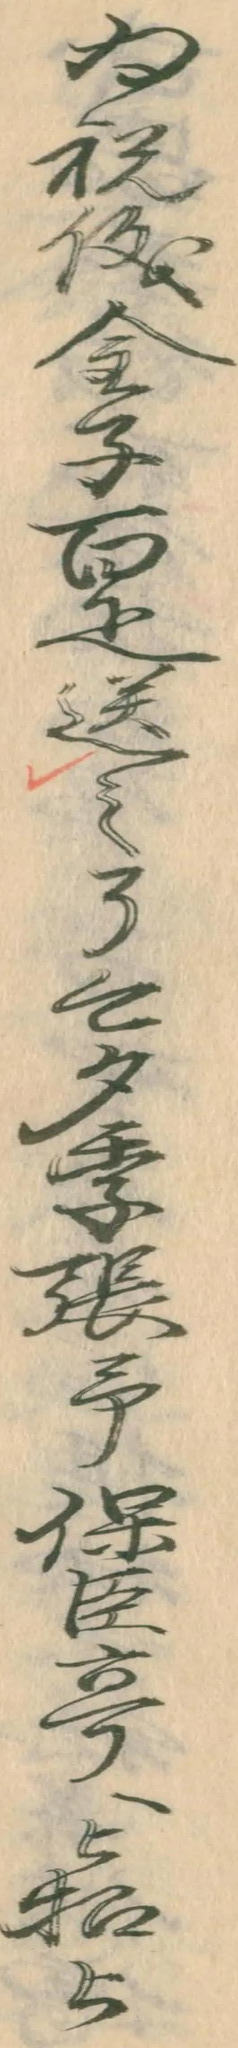為祝儀金子百疋送之了今夕季張予保臣亭ヘ被招上
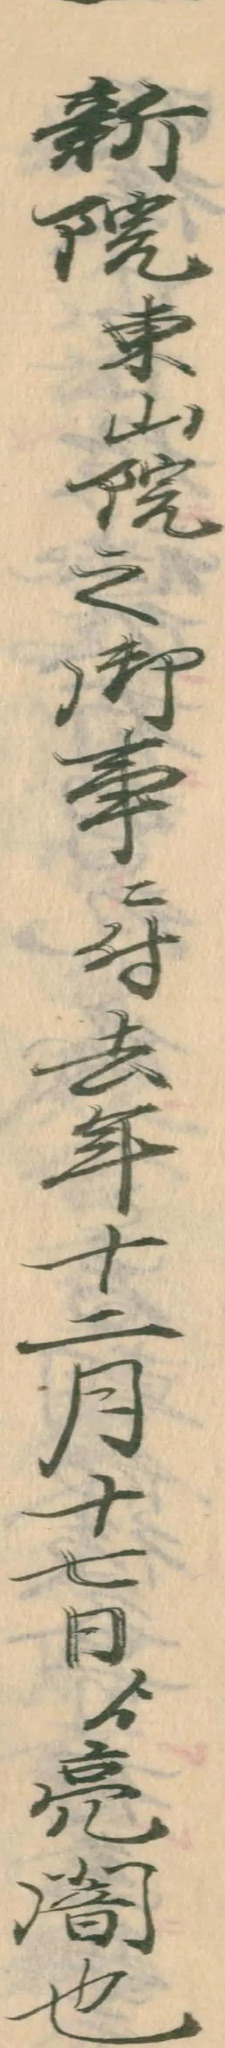一新院東山院之御事ニ付去年十二月十七日ゟ亮闇也
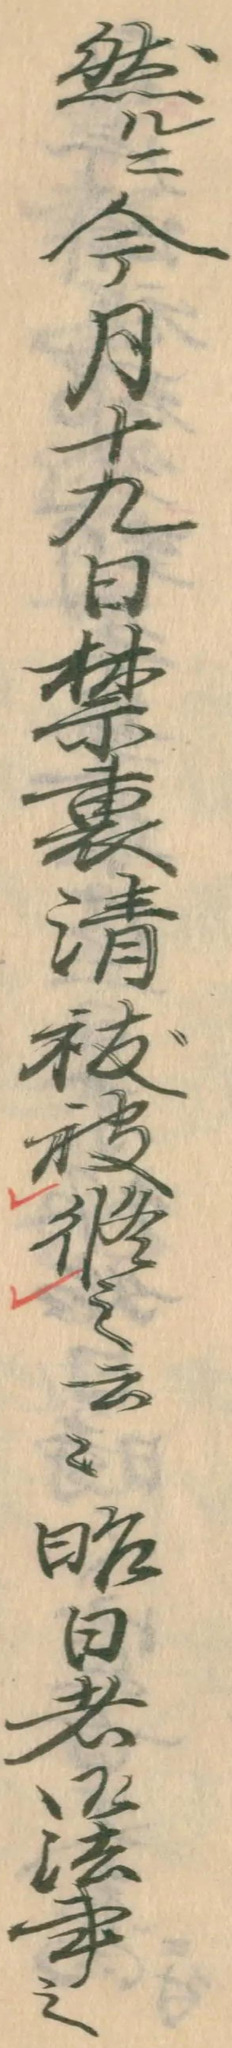然ルニ今月十九日禁裏清祓被修之云々昨日者御法事之
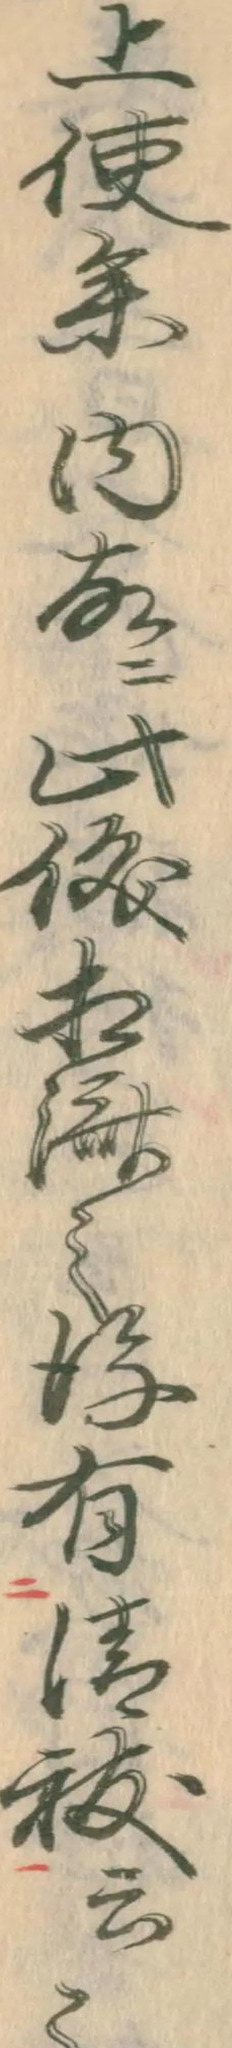上使参内故ニ此儀相済之後有清祓云々
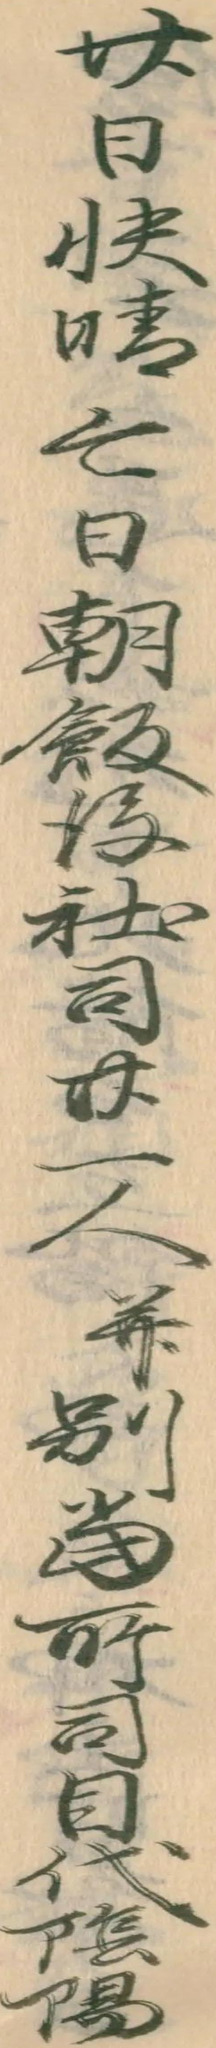廿日快晴今日朝飯後社司廿一人并別当所司目代陰陽
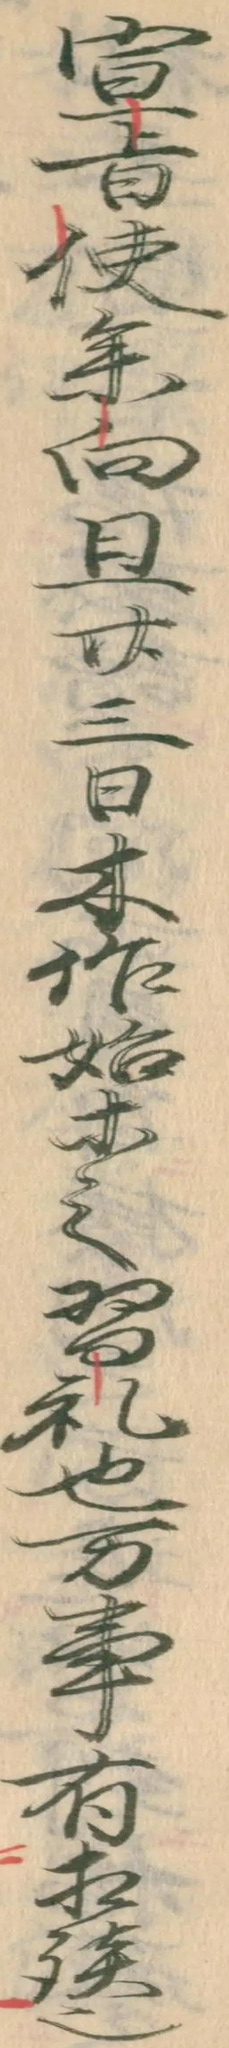宣-旨_使参-向且廿三日木作始等之習-礼也万事有相談也
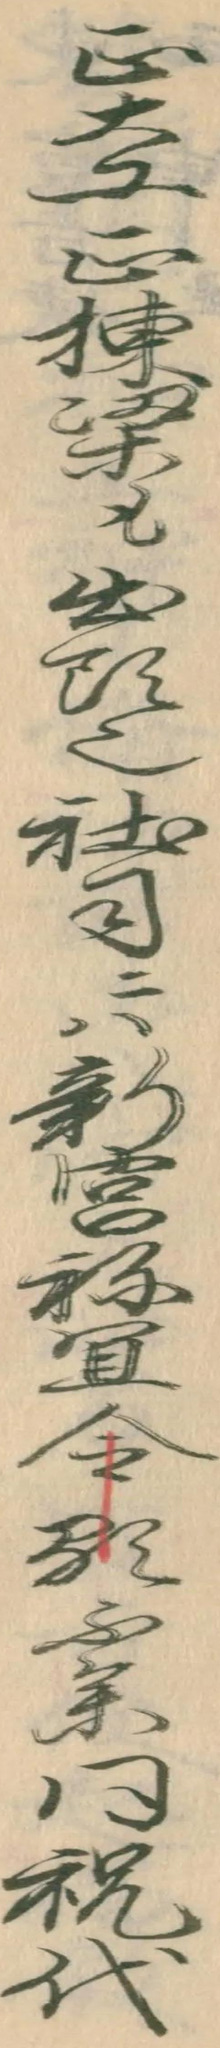正大工正棟梁も出頭也社司ニハ新宮祢宜令顕不参同祝代
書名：賀茂社記録. 第15冊
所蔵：国立国会図書館 National Diet Library, JAPAN
